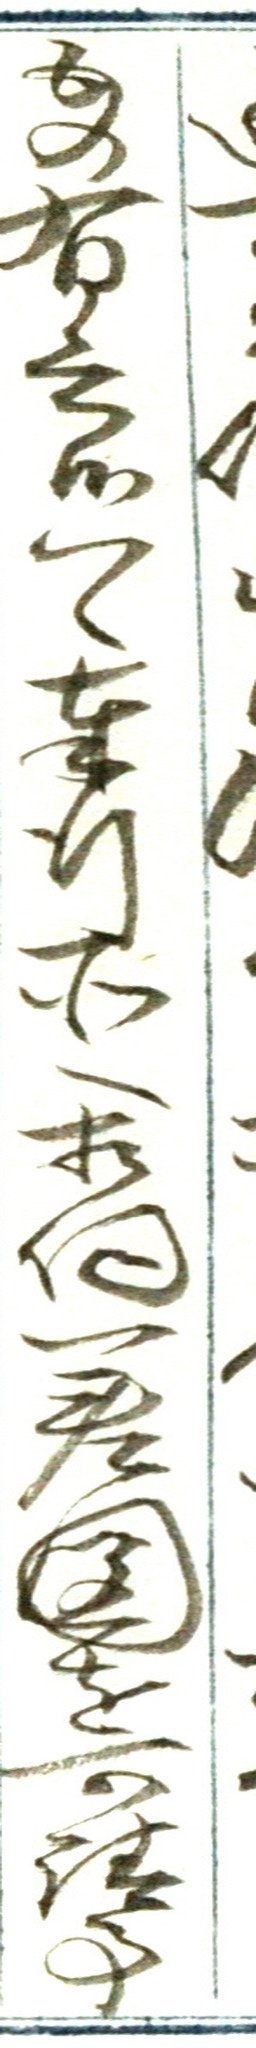もの有之候ハゝ奉行所へ相伺差図を可請事
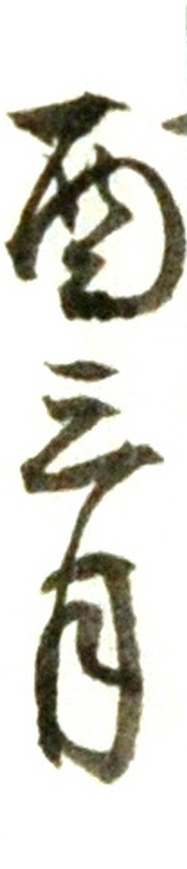酉三月

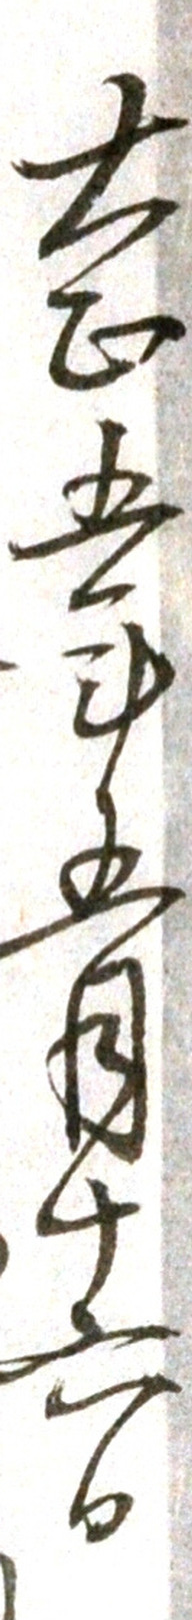大正五年五月十六日
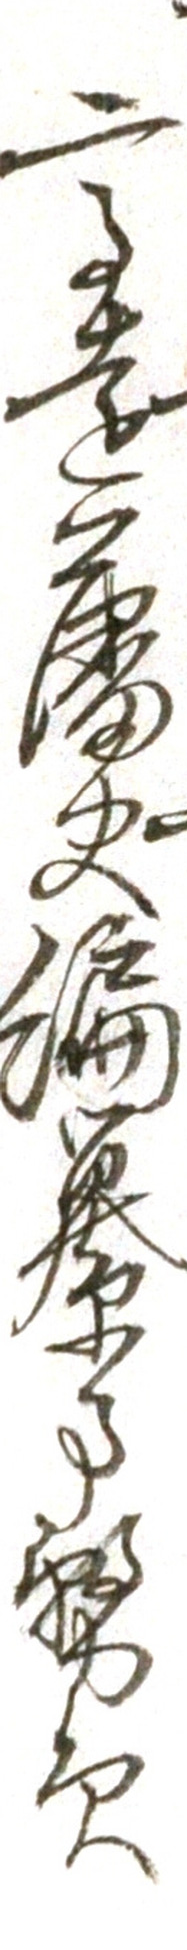高遠藩史編纂事務員
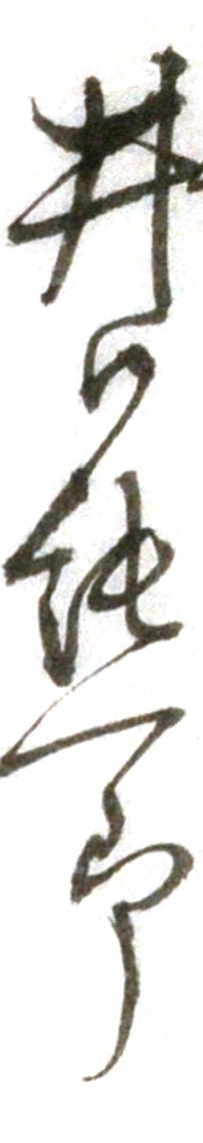井口純一郎
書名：町方御触書・二通
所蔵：伊那市立高遠町図書館・合同会社AMANE
